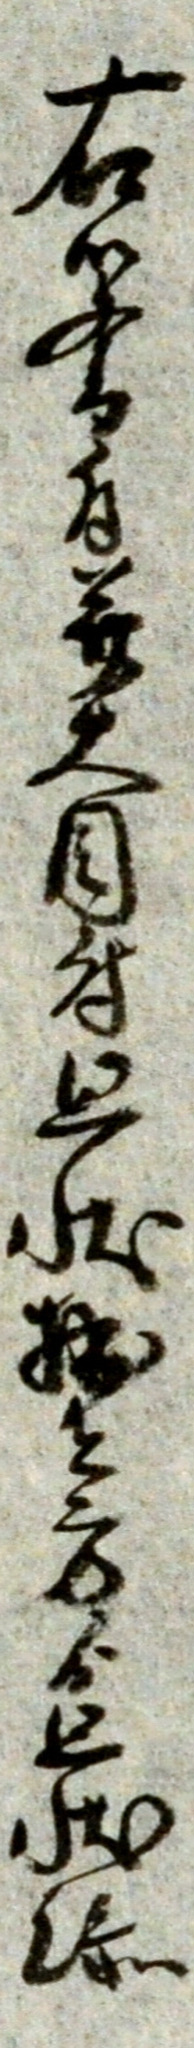右御書付幷大目付廻状拙者方ゟ廻状添
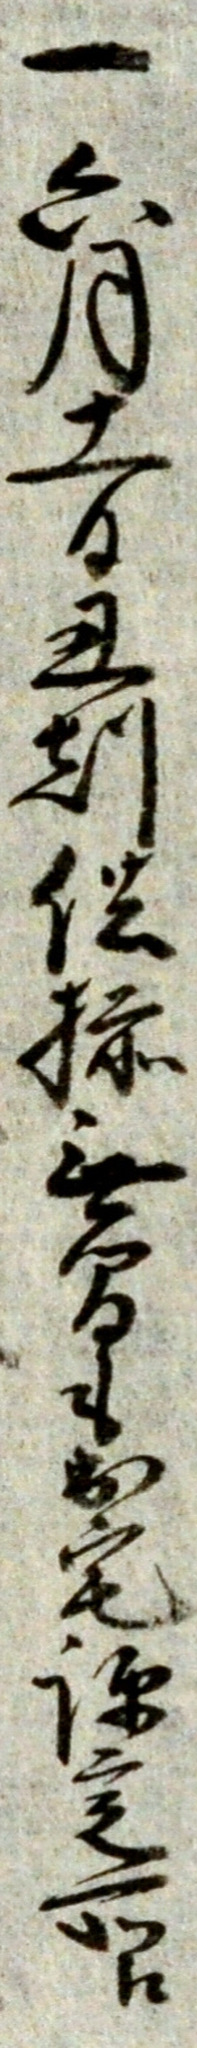一六月十一日丑刻供揃無間も出宅評定所江
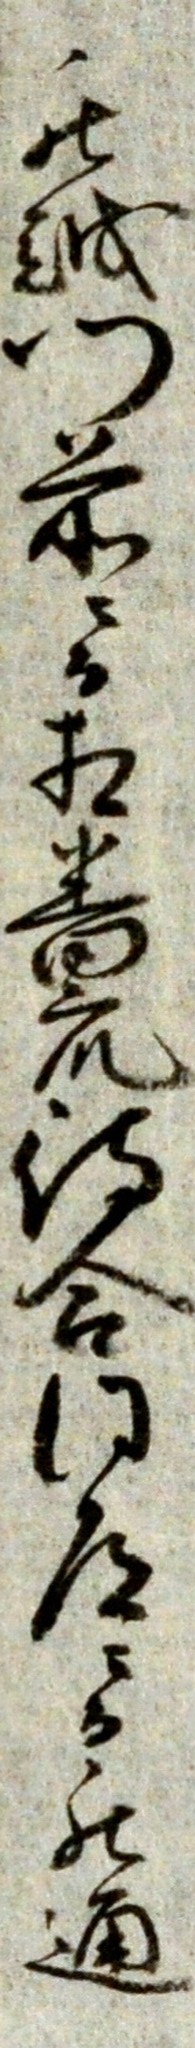罷越門前ニ而相番衆待合同道ニ而罷通
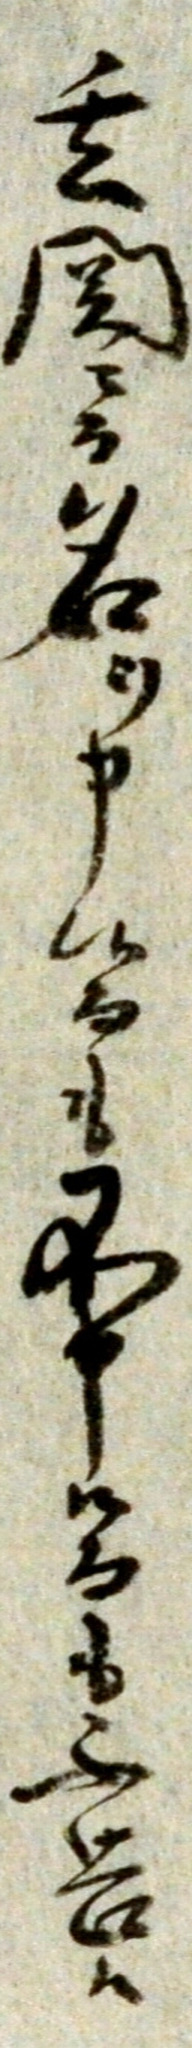玄関ニ而名リ申候而も不申候而も不苦候
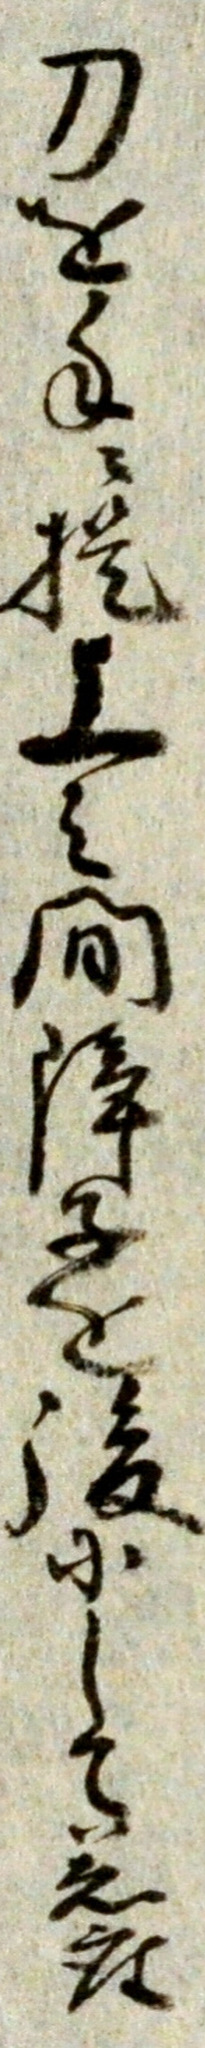刀を手ニ提上之間障子を後尓して着座
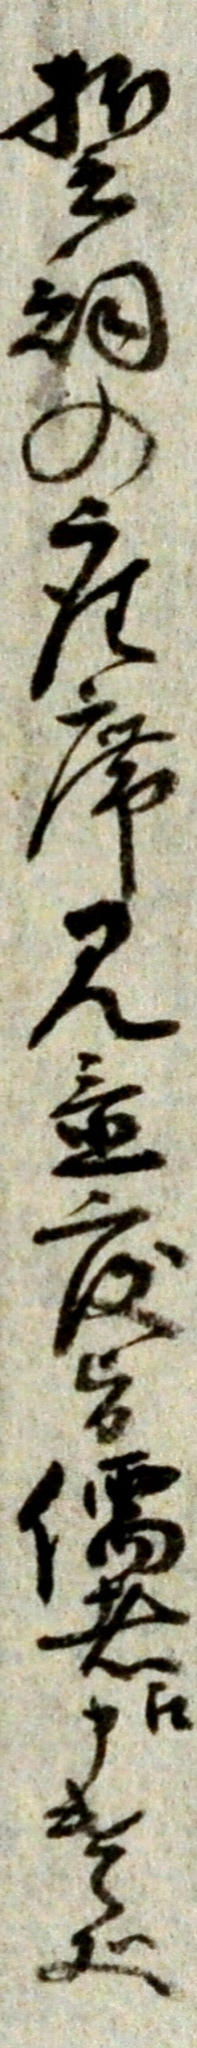誓詞乃座席見置度旨儒者江申遣候処
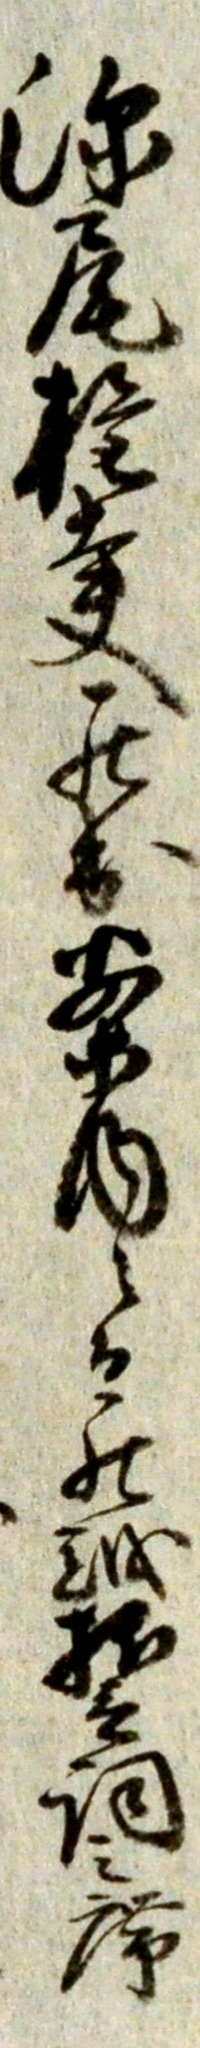源尾桂太夫罷出案内尓而罷越誓詞之席
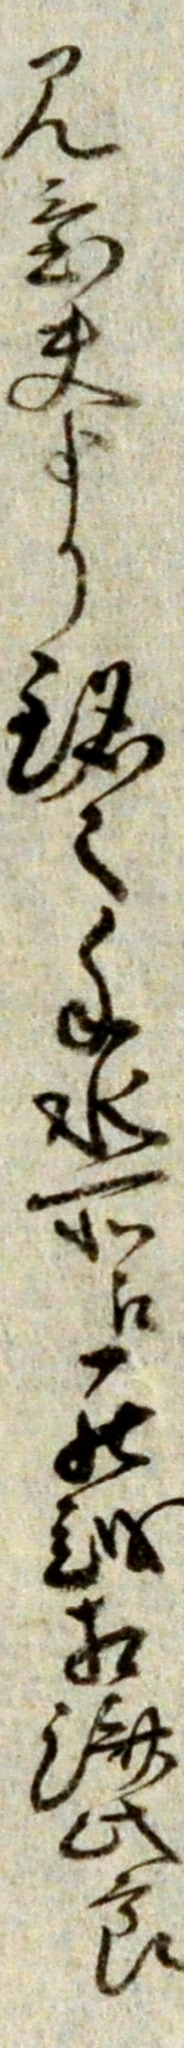見置夫より銘々手水所江罷越相済此節
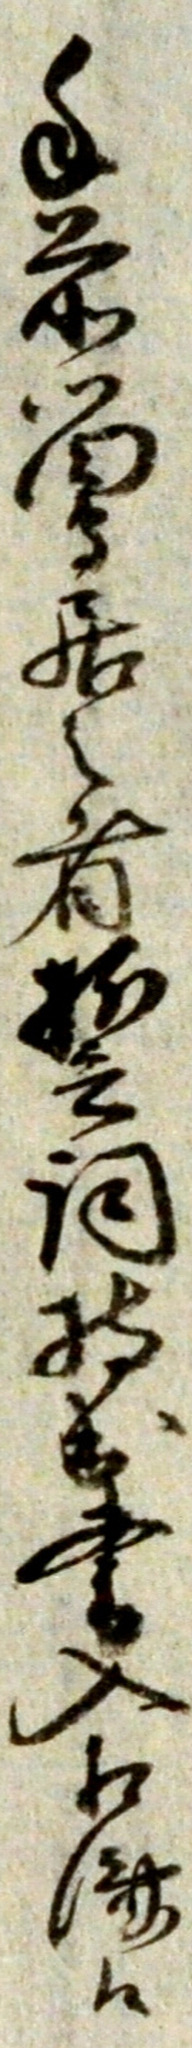手前留守居之者誓詞持出書入相済候
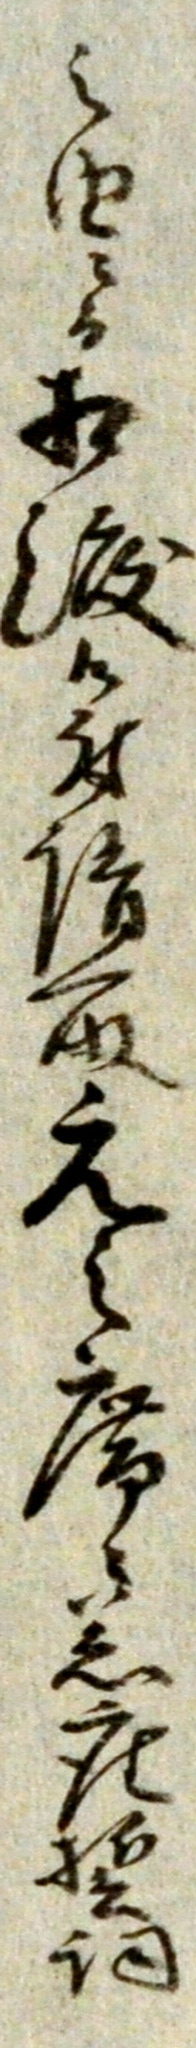之由ニ而相渡候請取元之席二着座誓詞
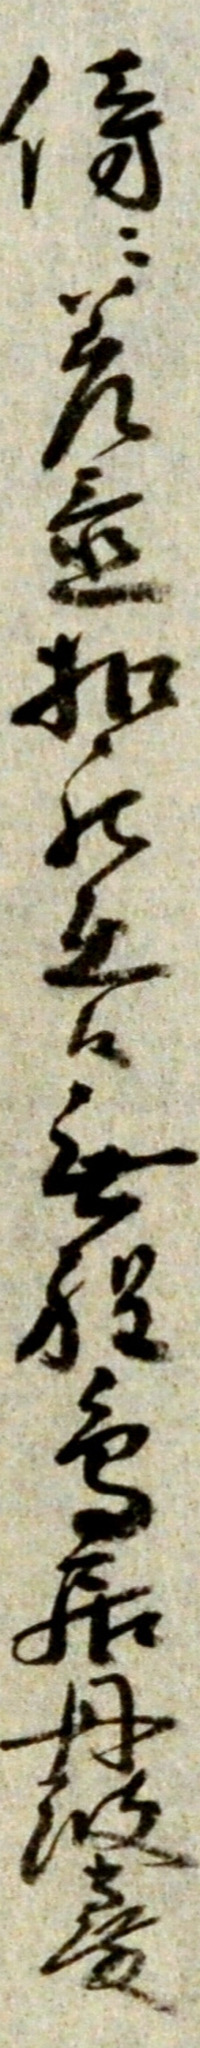傍二差置扣罷在候無程鳥居丹波守殿
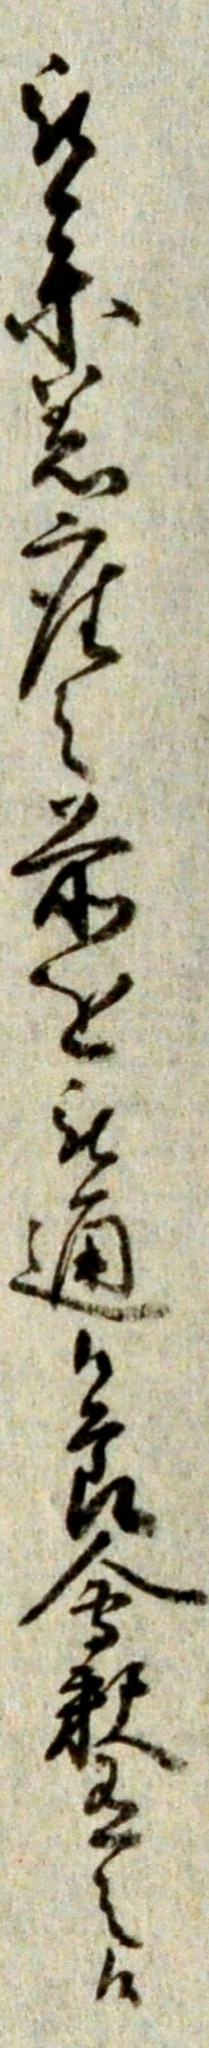被参着座之前を被通候節会釈有之候
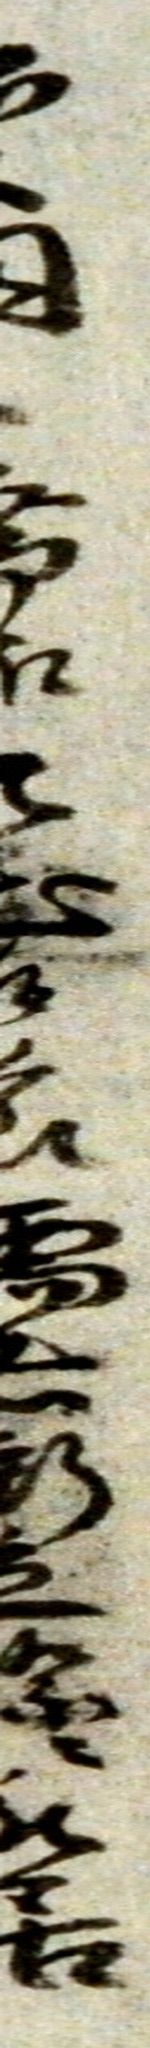誓詞之席江罷出候節儒者衝立際ニ被居
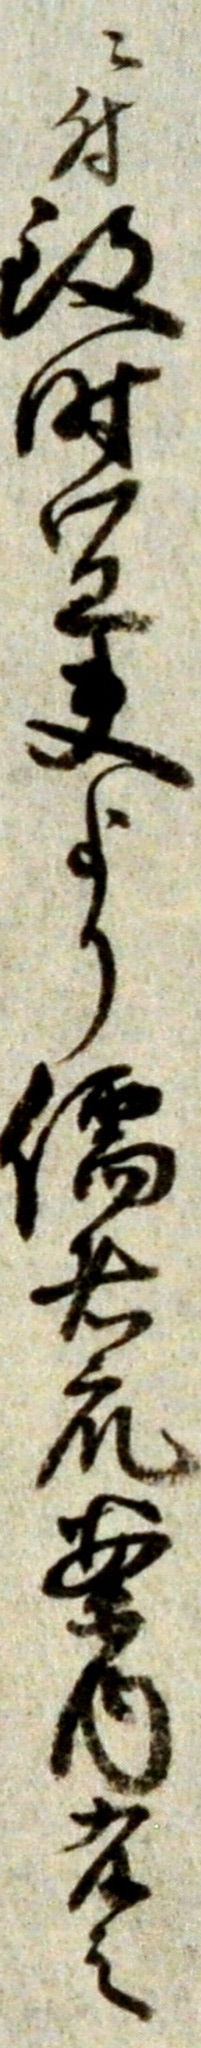ニ付致時宜夫より儒者衆案内有之

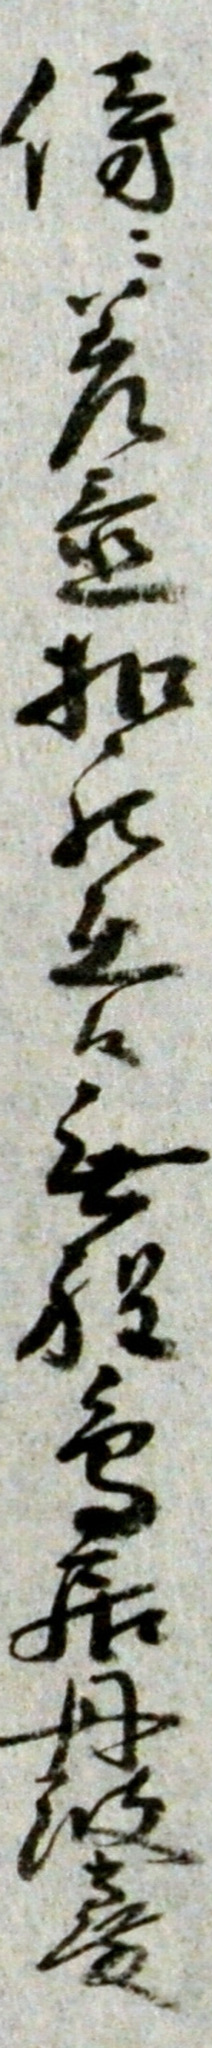傍ニ差置扣罷在候無程鳥居丹波守殿
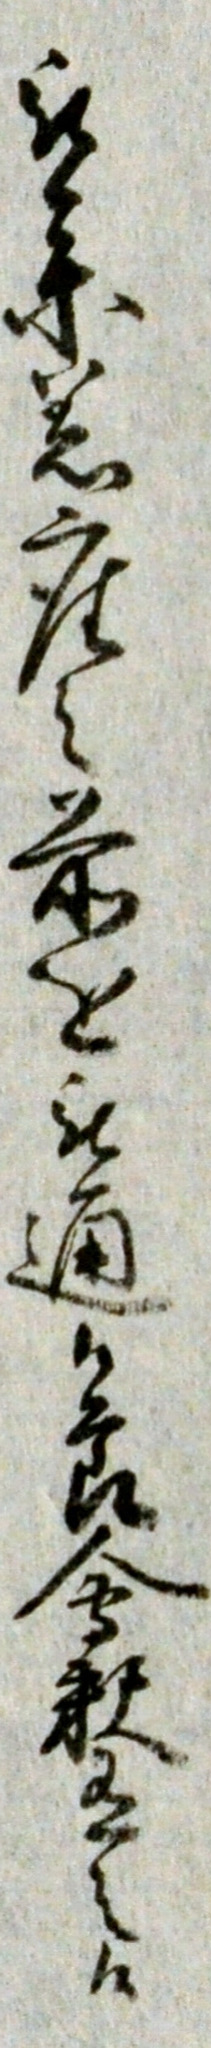被参着座之前被通り節会釈有之候
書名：大阪加番関係諸書留〔一括〕
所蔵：伊那市立高遠町図書館・合同会社AMANE
